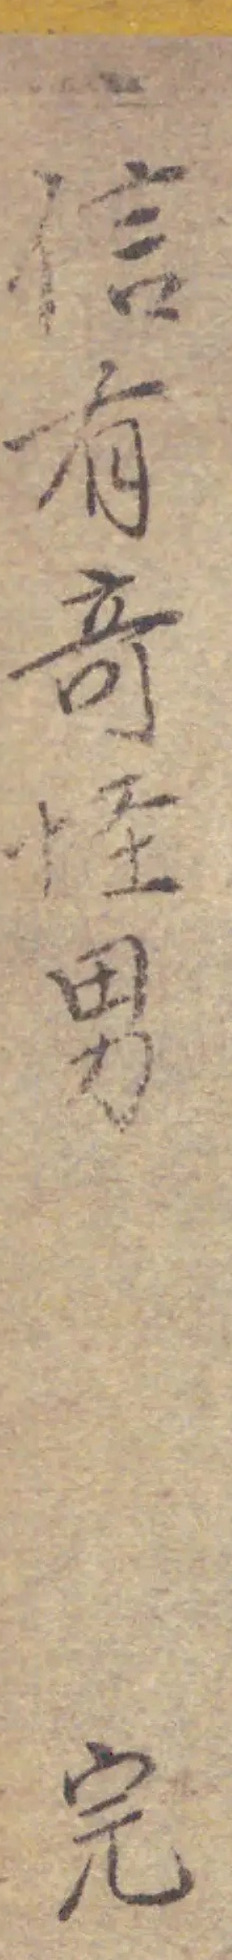信有奇怪男完

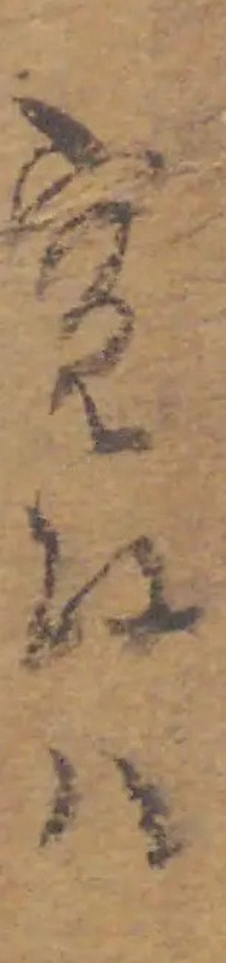寛政八
